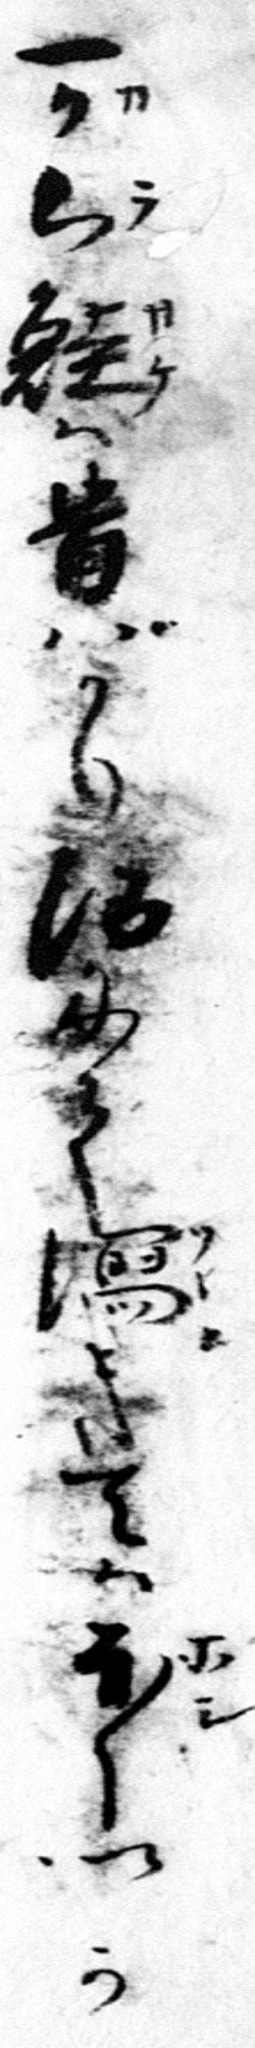一から鮭は骨はかり酒にて瀉きてはほしいか
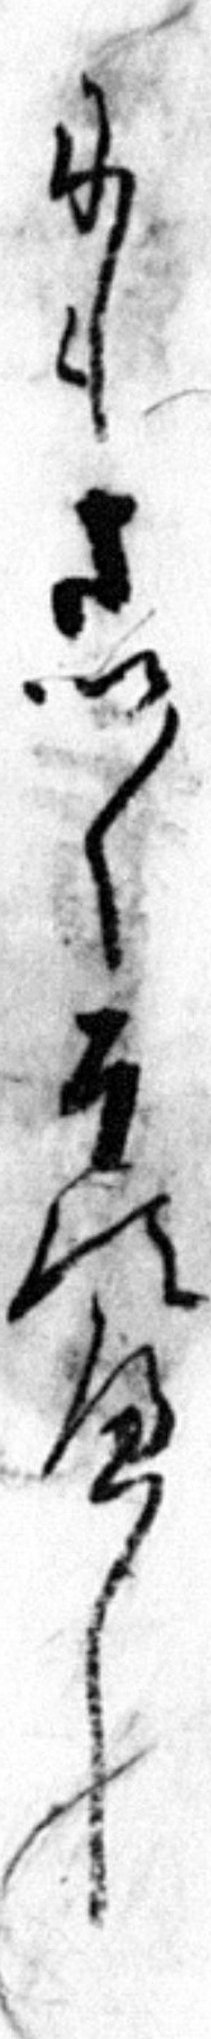にもさい〳〵干すへし
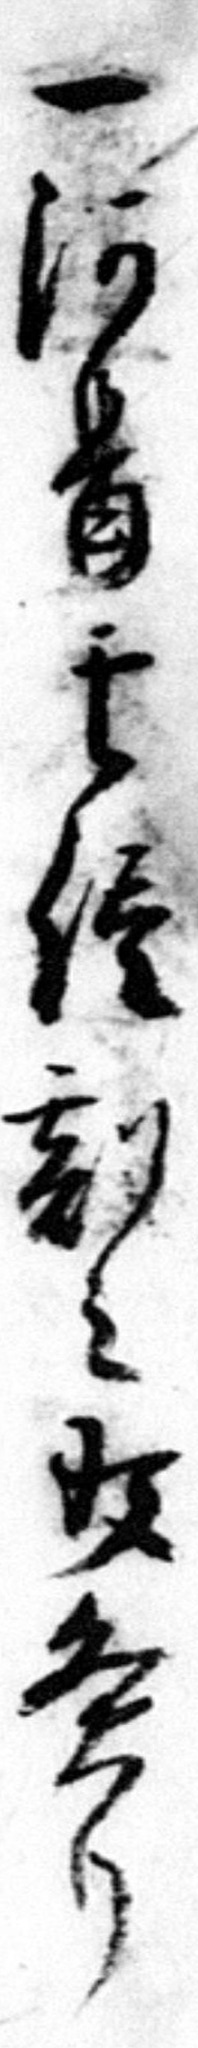一河骨其侭刻み少し灸り
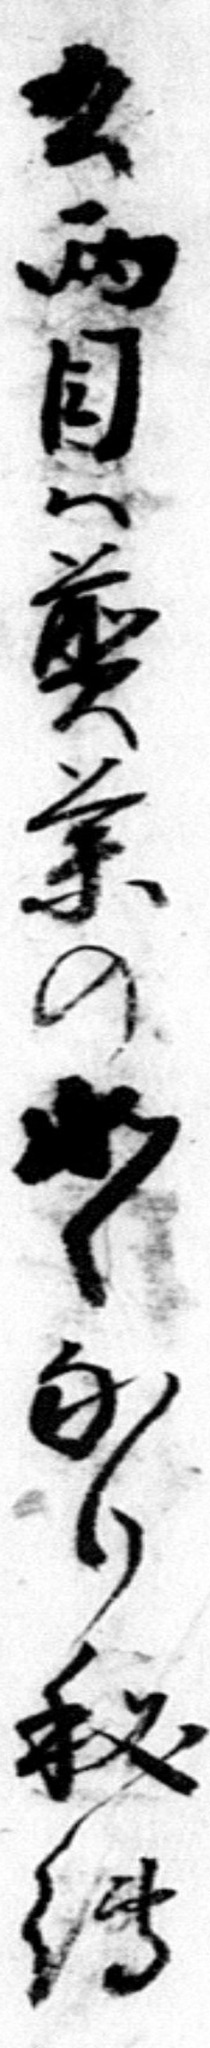右両目は煎薬の如くなり秘伝
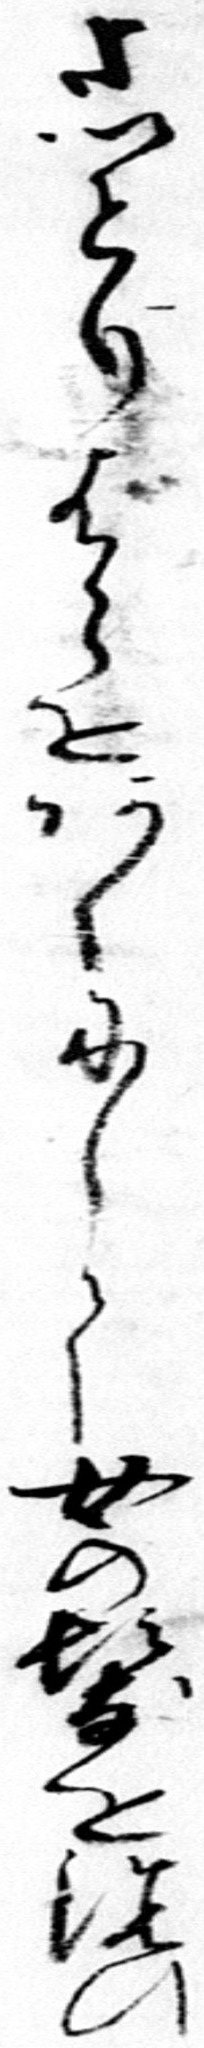さいとりばらをあくにして女の髪を洗ひ
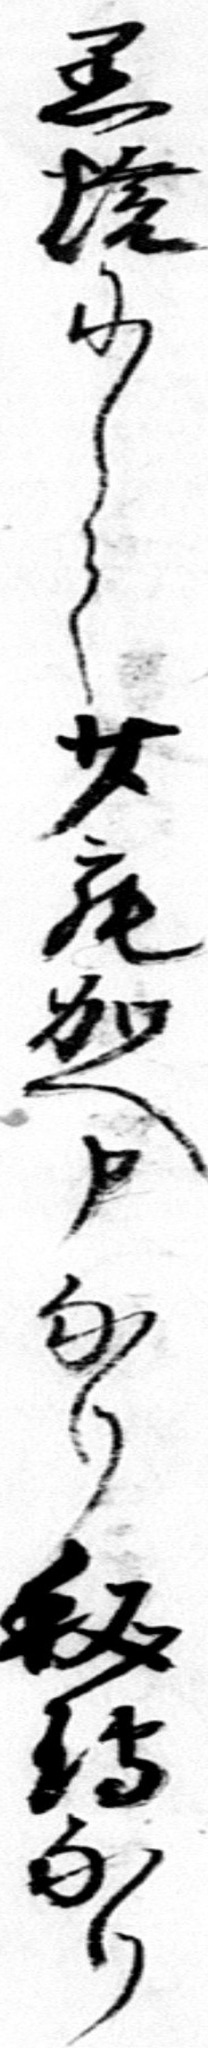黒焼にして少宛加へ申なり秘伝なり
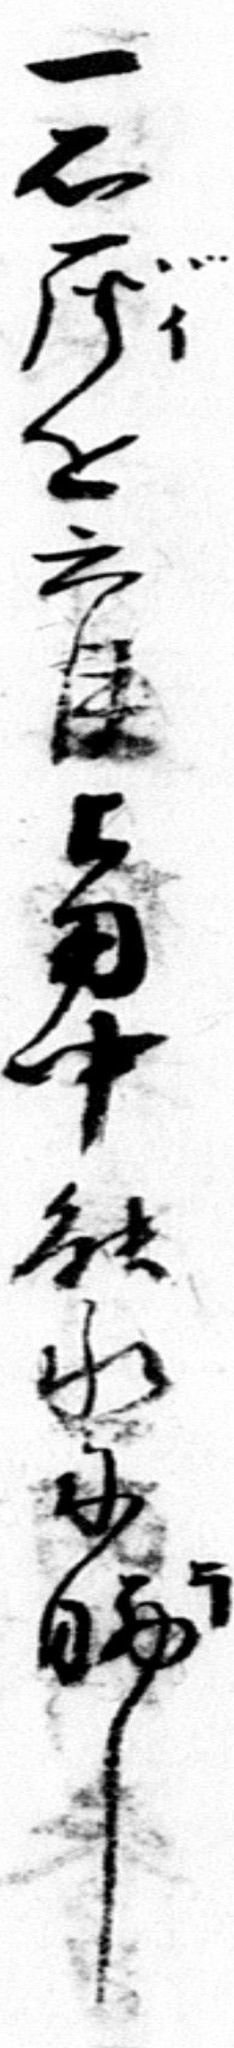一石灰を六目土用中の水に晒し
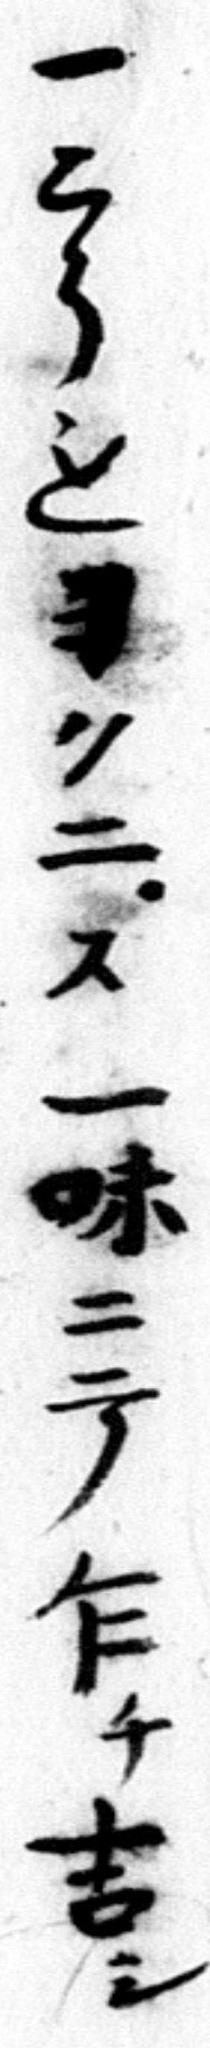一こうれよくにす一味にて乍ち吉し
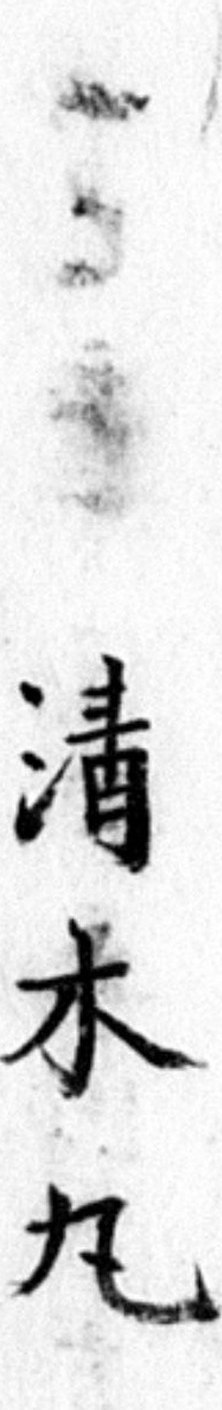清木丸
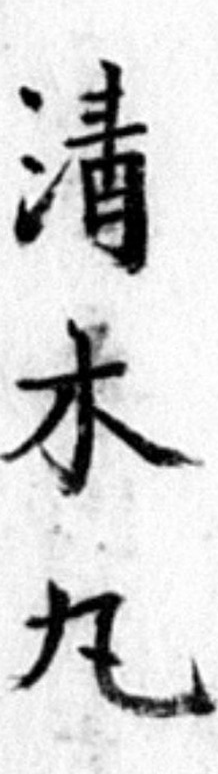清木丸
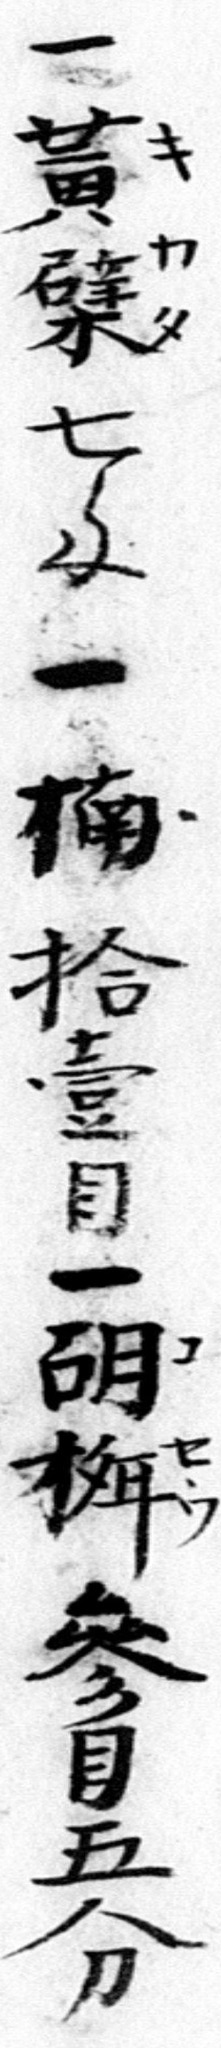一黄檗七匁一楠拾台目一胡椒参目五分
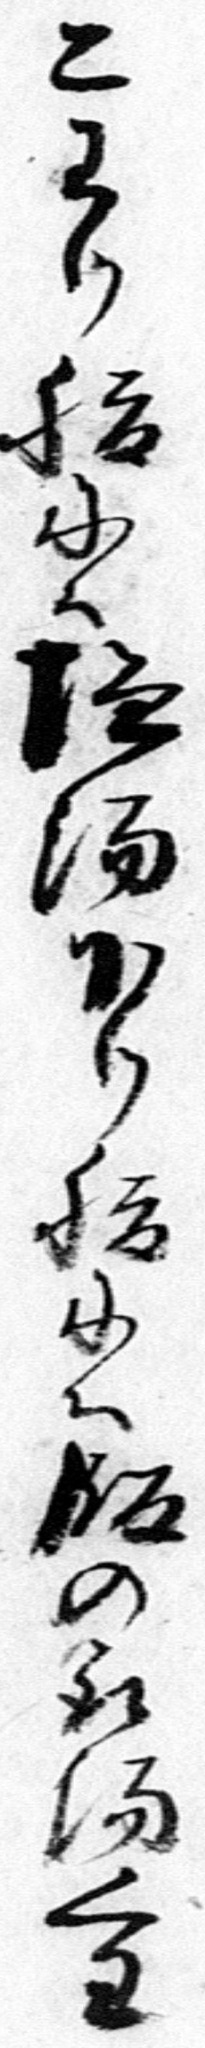こわり腹には塩湯下り腹には飯の取湯くわ
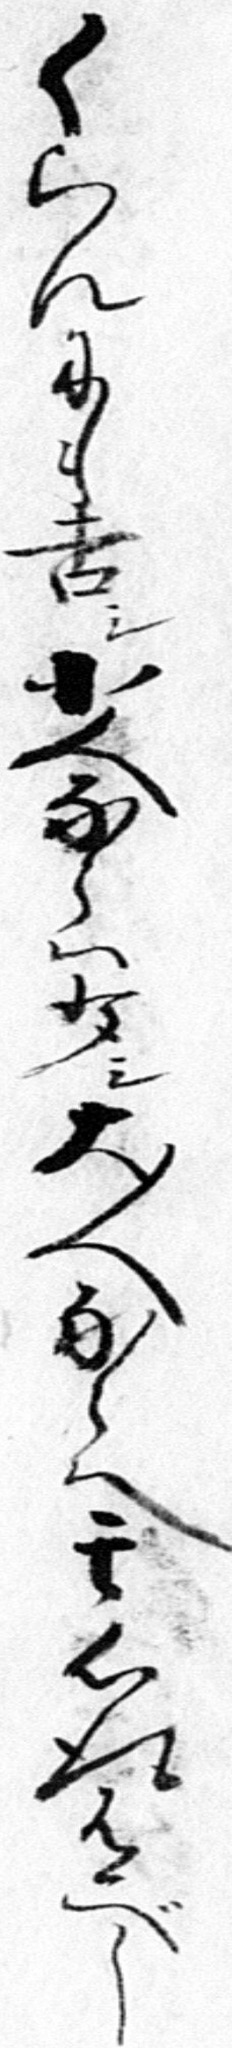くらんにも吉し小人ならは少し大人ならは其心得有べし
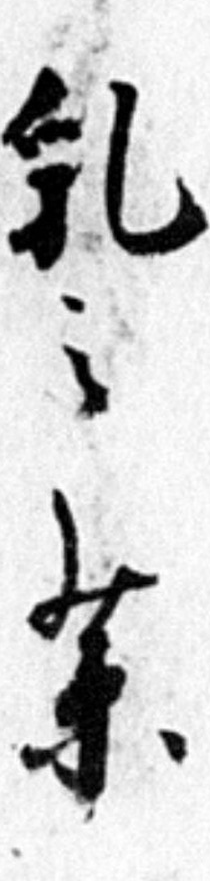乳之薬
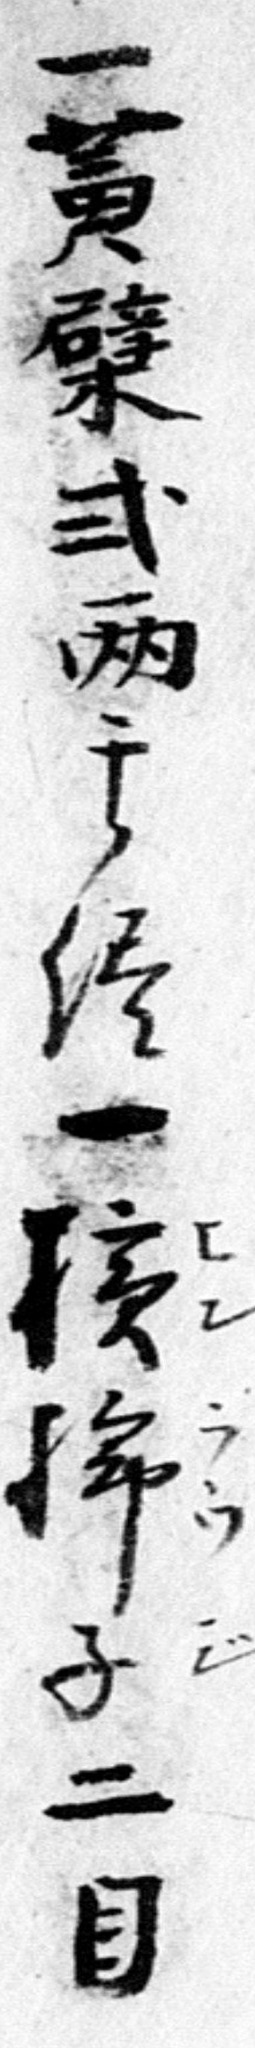一黄檗弐両其侭一檳榔子二目
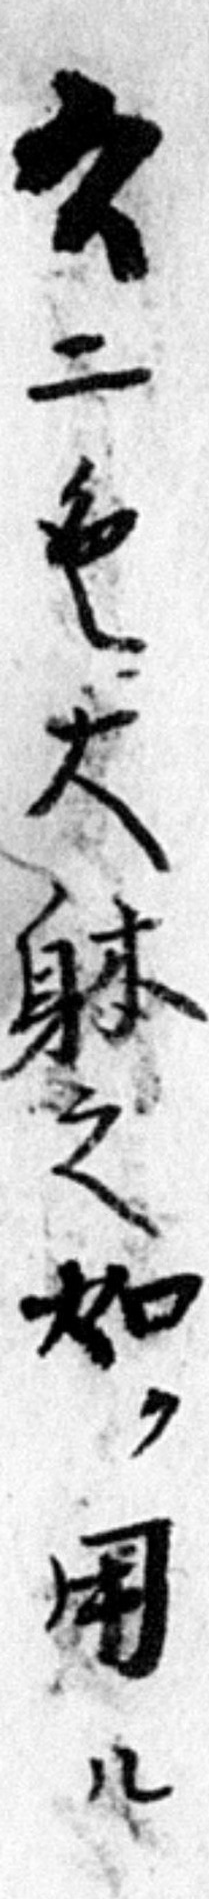右二色大体之如く用る
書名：名薬秘伝之書
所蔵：徳島県立図書館
